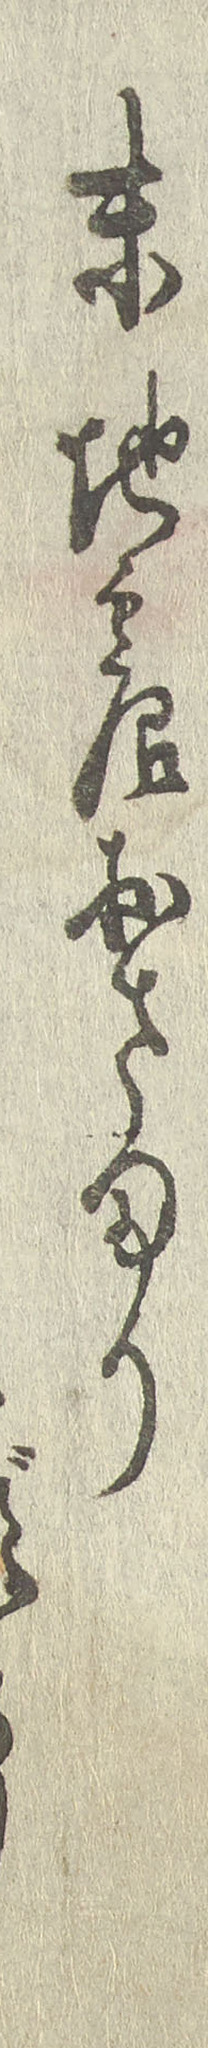未地震おさまり
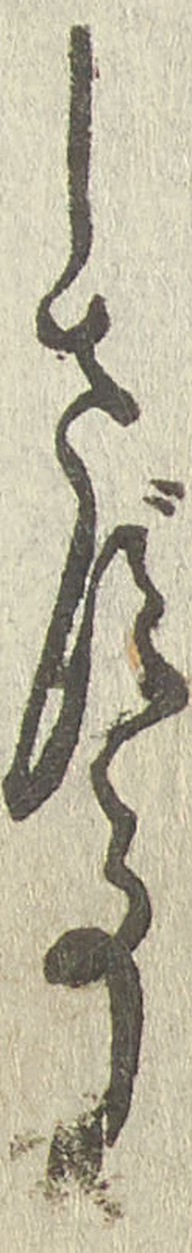申さず事
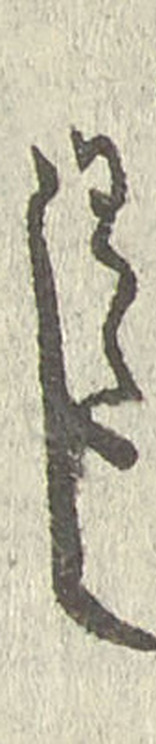わたし
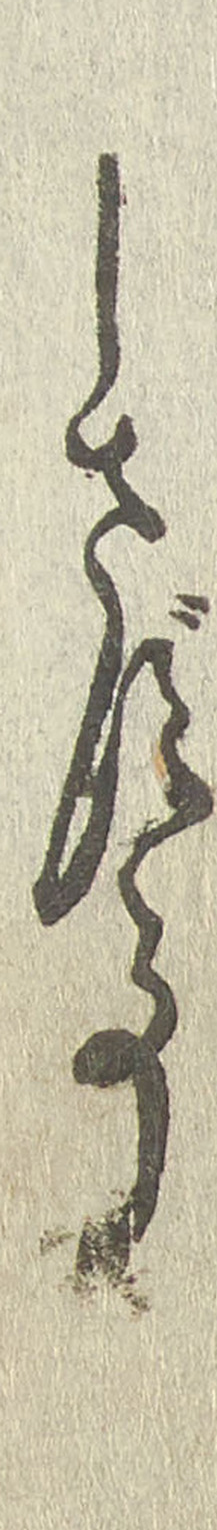申さず事
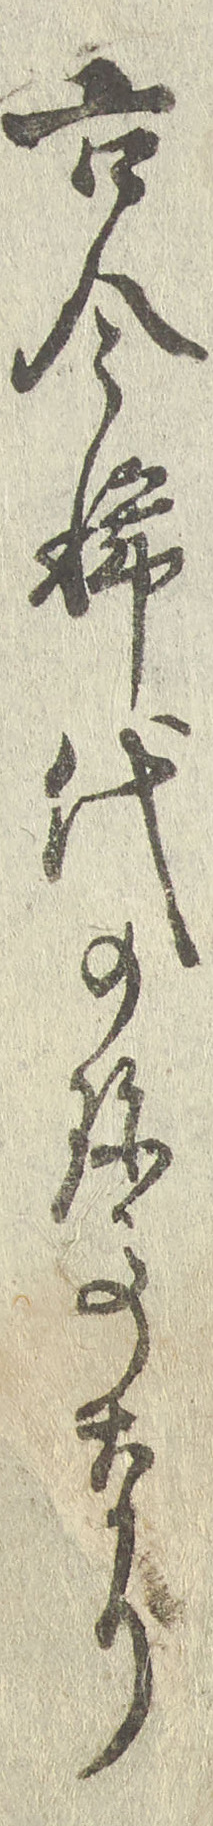古今稀代の珍事なり
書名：摂津大津波次第
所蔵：東京大学総合図書館 General Library in the University of Tokyo, JAPAN
